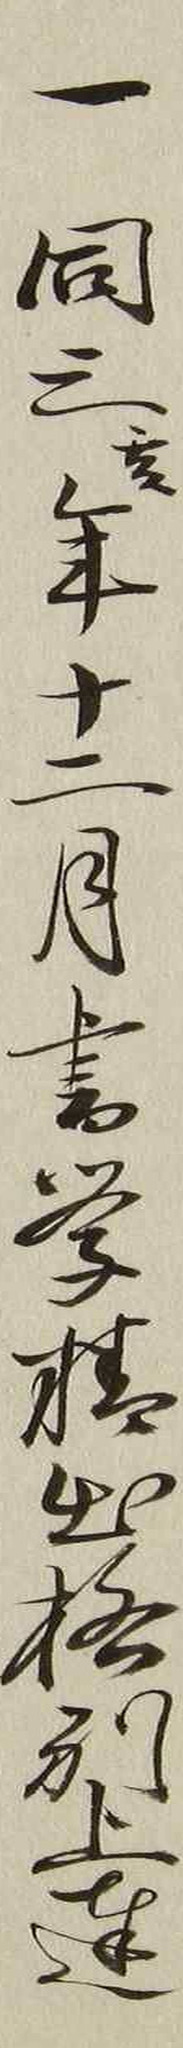一同三亥年十二月書学精出格別上達
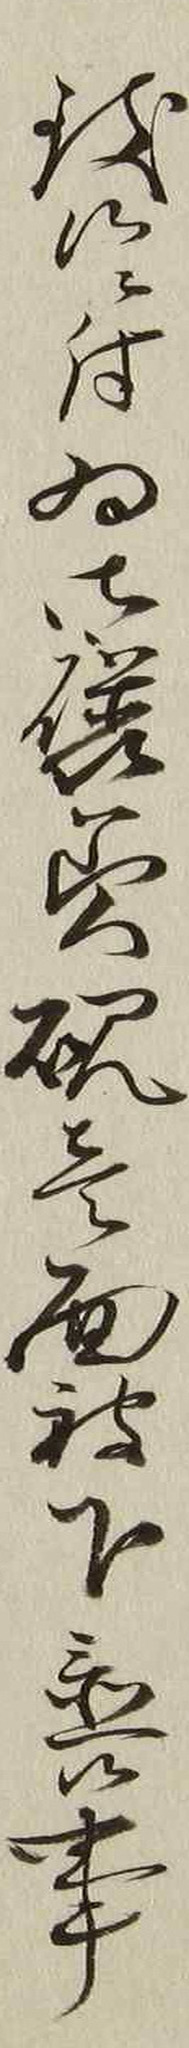致候に付為御褒美硯壱面被下置候事
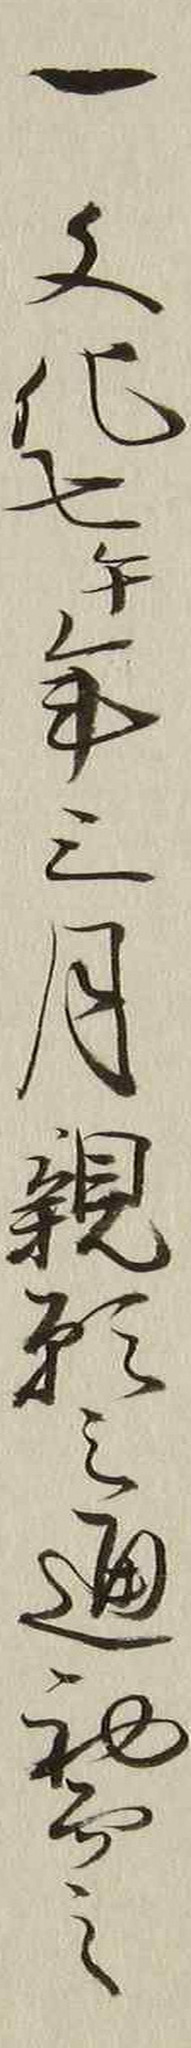一文化七午年三月親願之通初而之
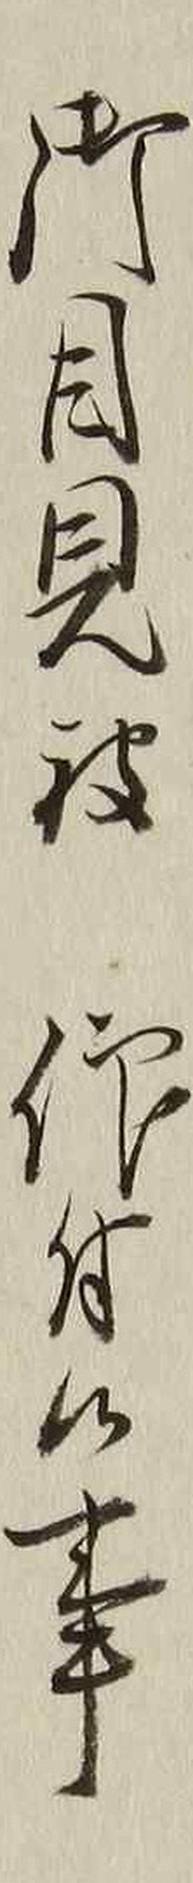御目見被仰付候事
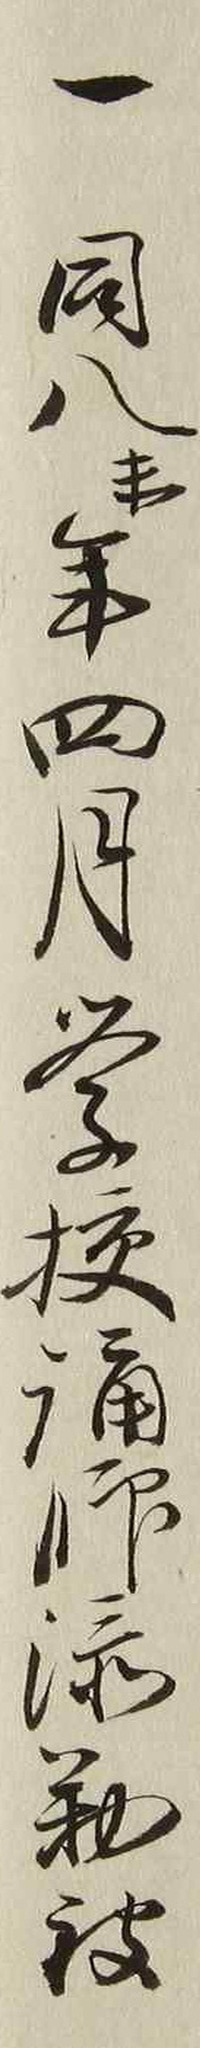一同八未年四月学校誦師添勤被
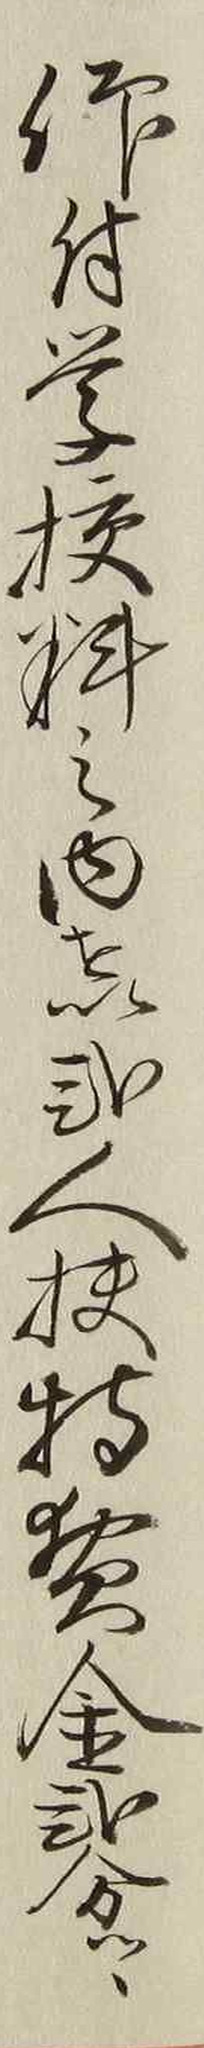仰付学校料之内を以弐人扶持費金弐分つゝ
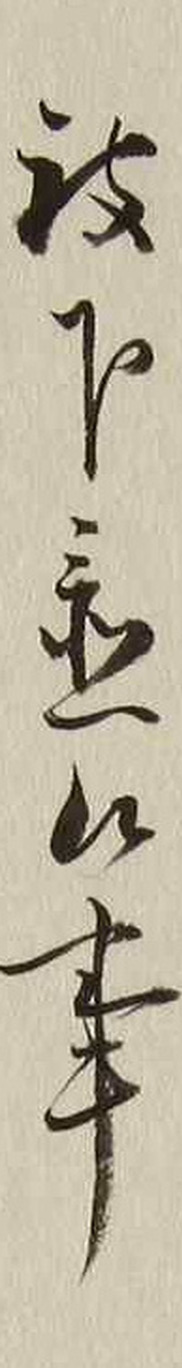被下置候事
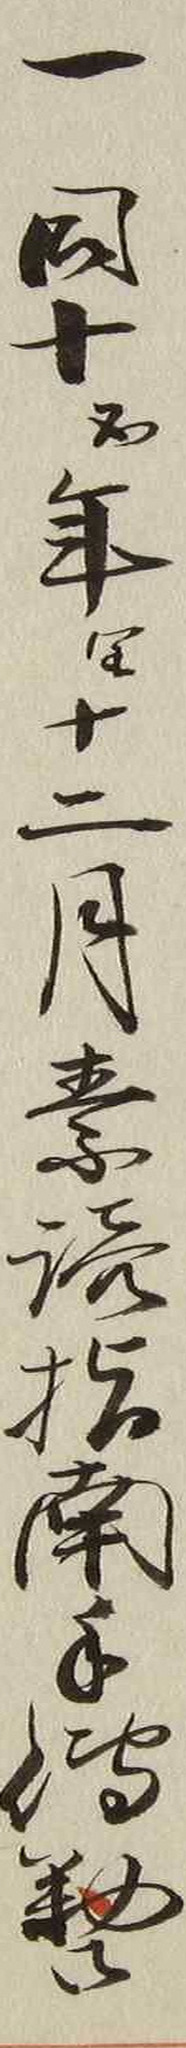一同十酉年閏十二月素読指南手伝勤御
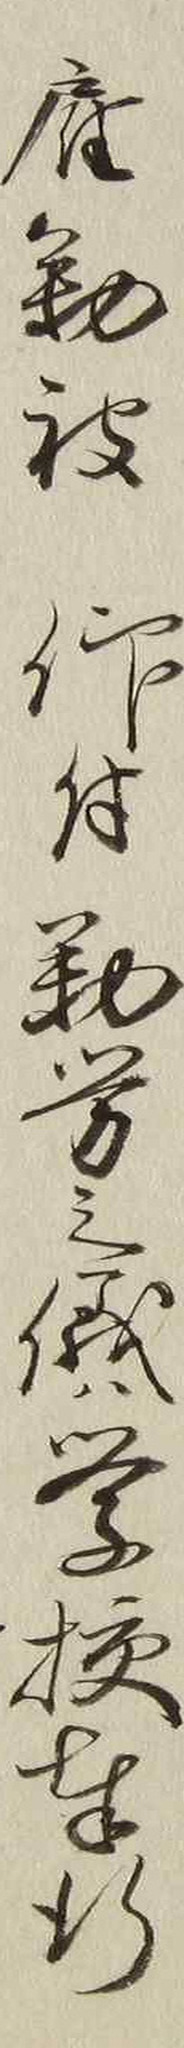雇勤被仰付勤労之儀は学校奉行
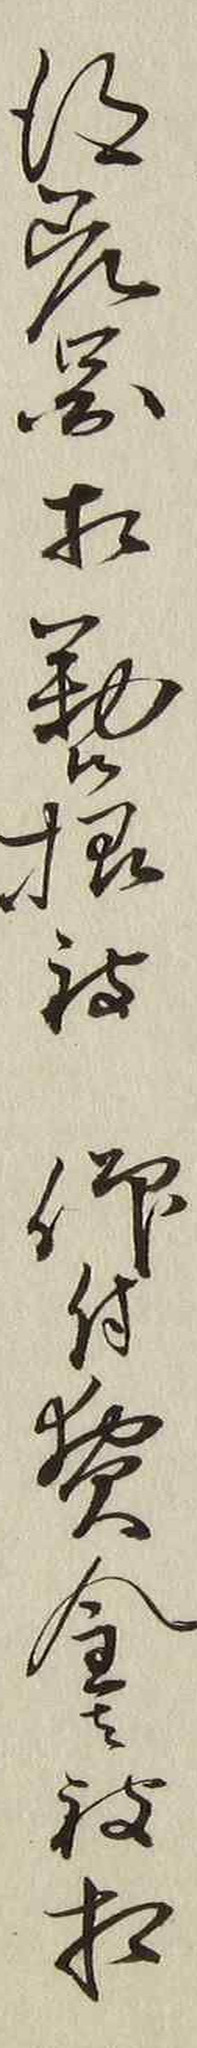得差図相勤候様被仰付費金は被相
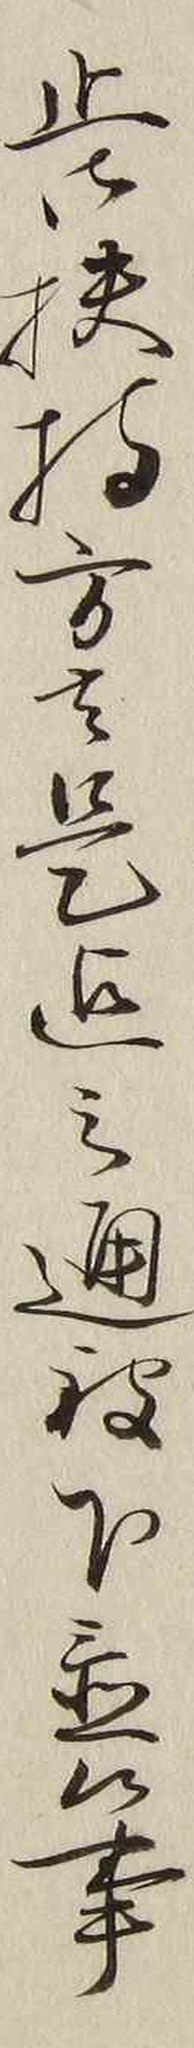止御扶持方は是迄之通被下置候事
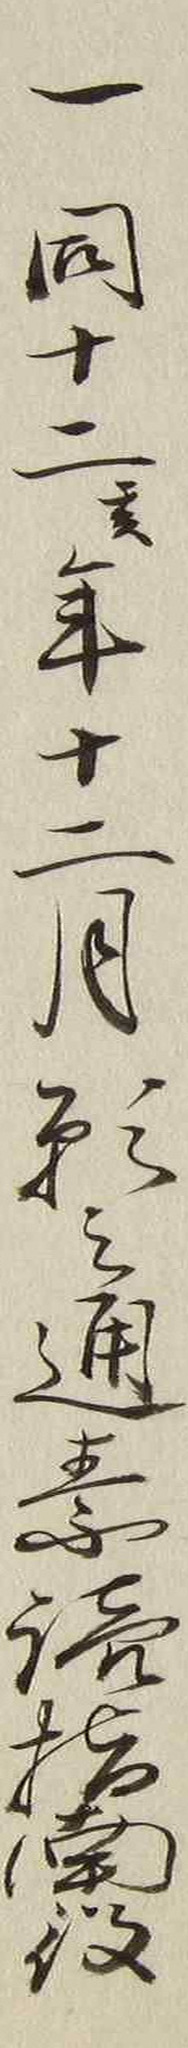一同十二亥年十二月願之通素読指南役
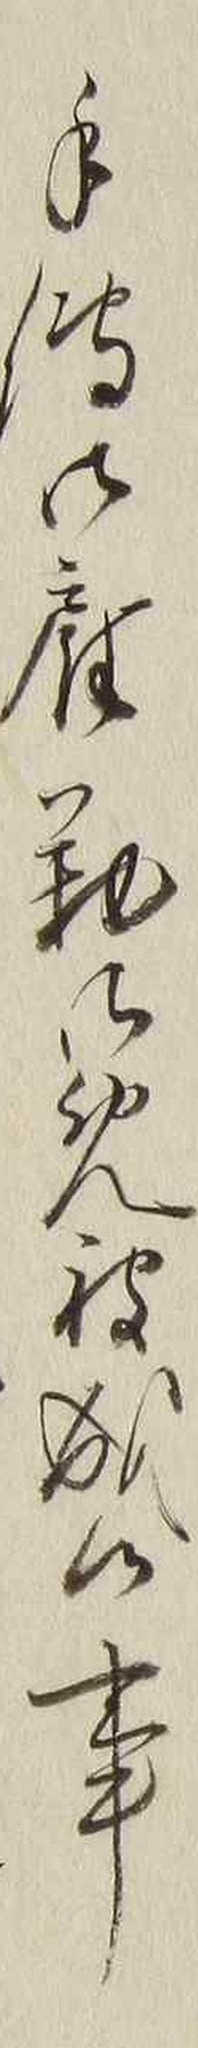手伝御雇勤御免被成候事
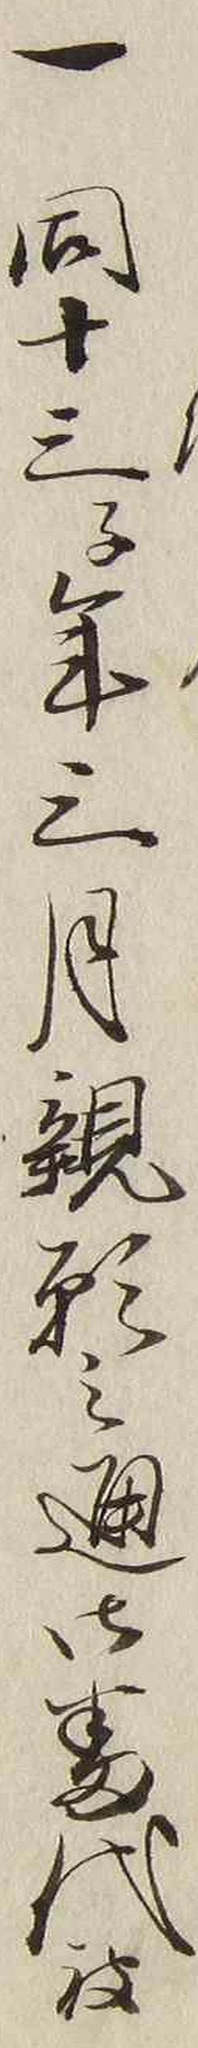一同十三子年三月親願之通御番代被
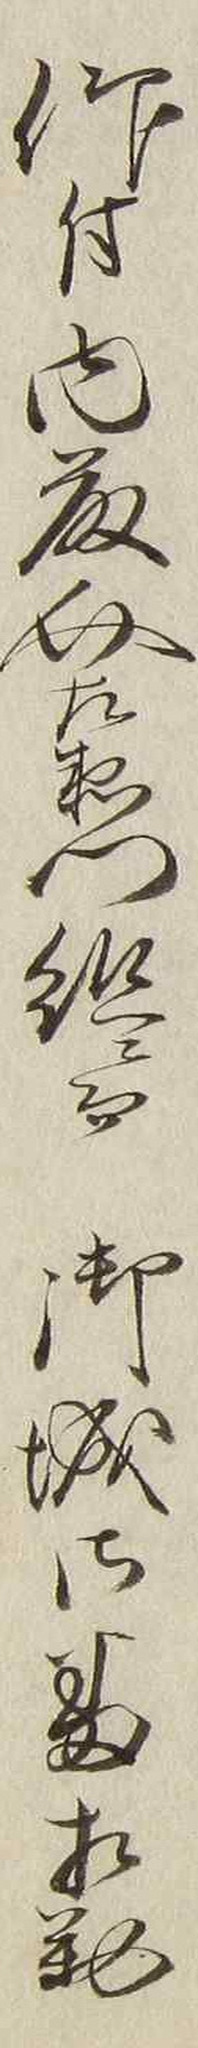仰付内藤介左衛門組に而御城御番相勤

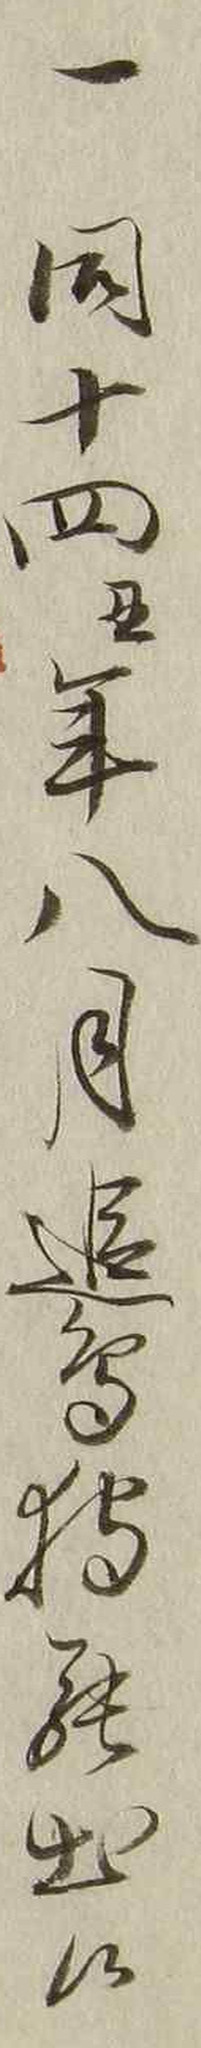一同十四丑年八月追鳥狩罷出候
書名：諸士系譜　巻之157　ね之部1
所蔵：会津若松市立会津図書館
